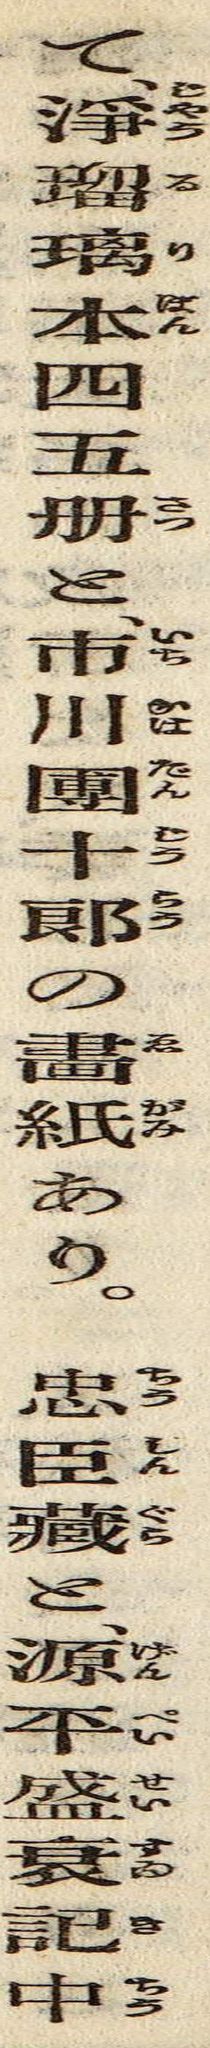て浄瑠璃本四五冊と、市川団十朗の画紙あり。忠臣蔵と源平盛衰記中
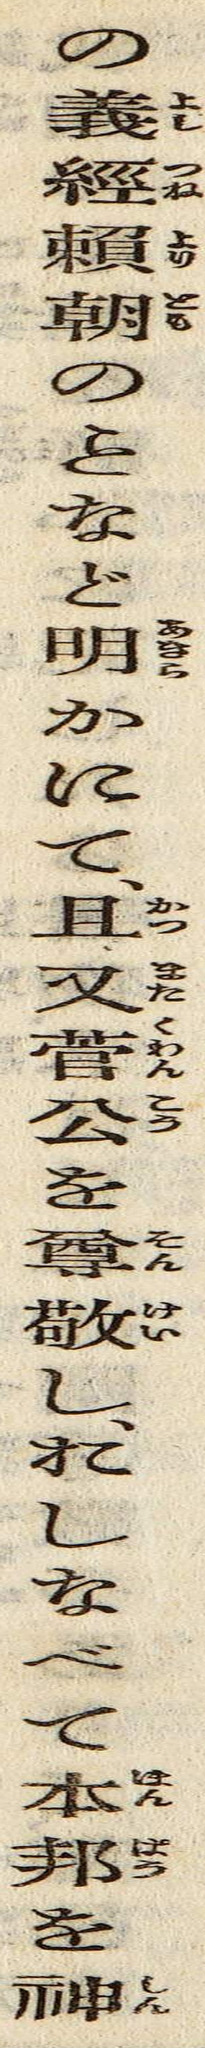の義経頼朝のことなど明かにて、且又菅公を尊敬し、おしなべて本邦を神
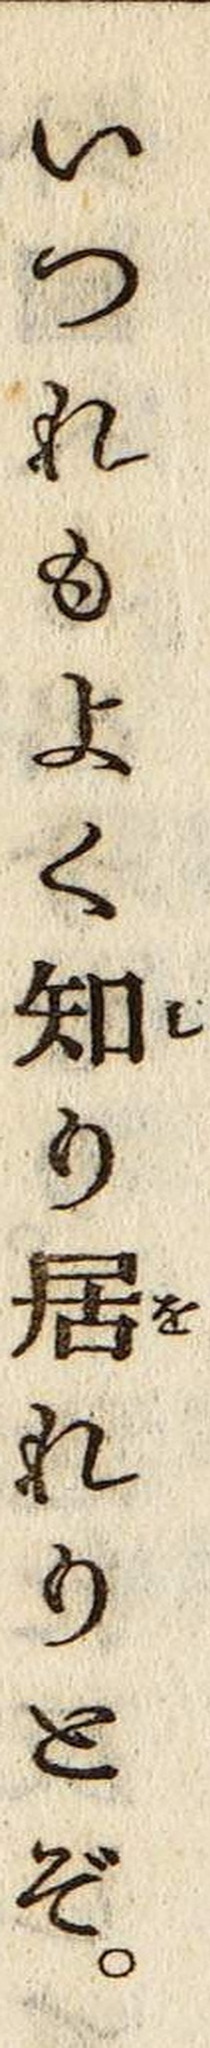いつれもよく知り居れりとぞ。
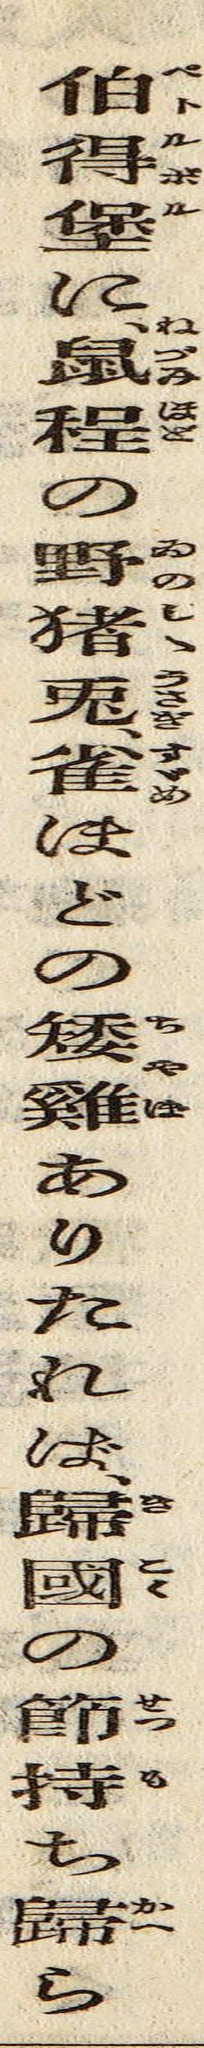伯得堡に、鼠程の野猪兎、雀ほどの矮鶏ありたれば、帰国の節持ち帰ら
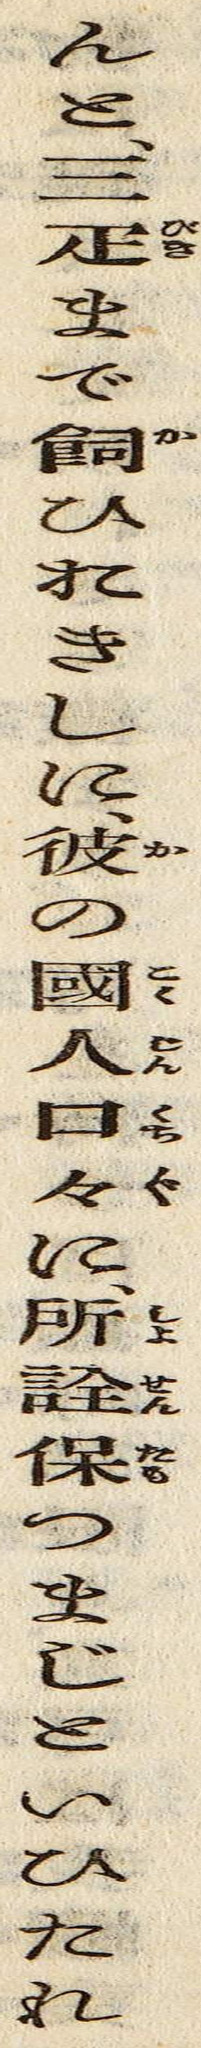んと、三匹まで飼ひおきしに、彼の国人口々に、所詮保つまじといひたれ
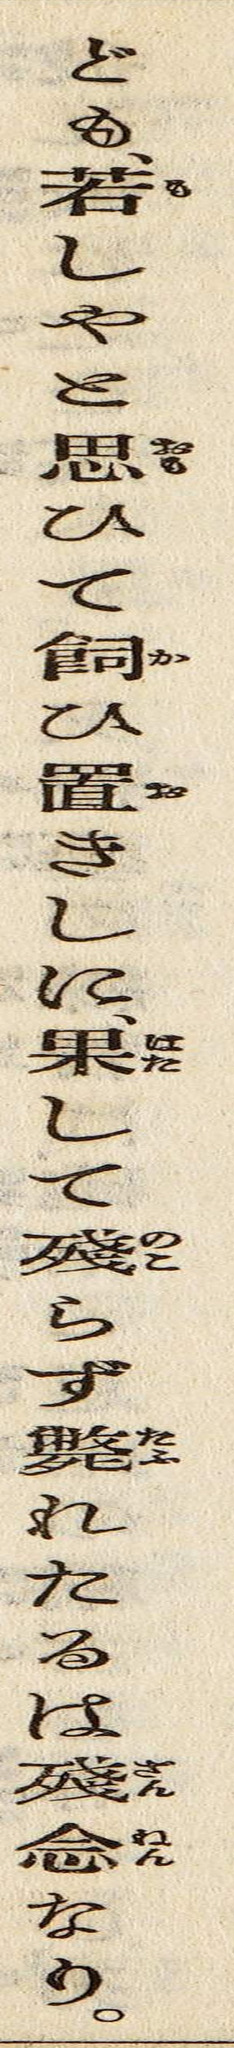ども、若しやと思ひて飼ひ置きしに果して残らず斃れたるは残念なり。
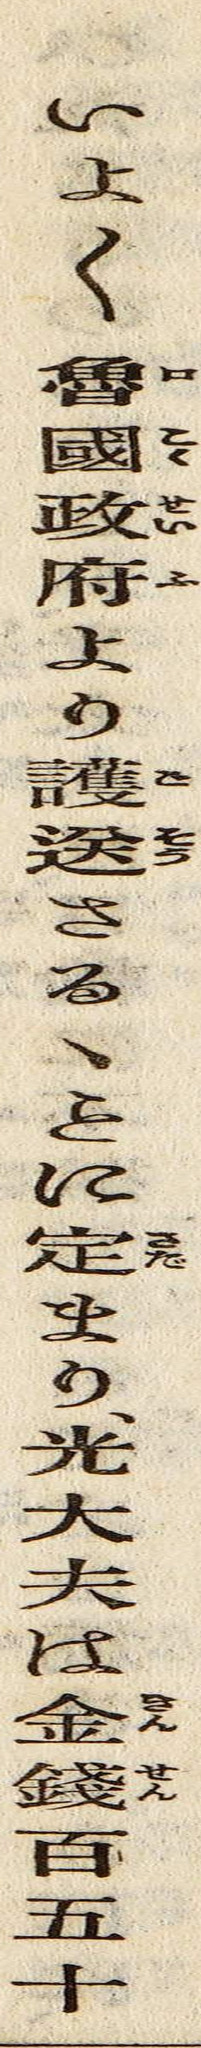いよ〳〵魯国政府より護送さるゝことに定まり、光大夫は金銭百五十
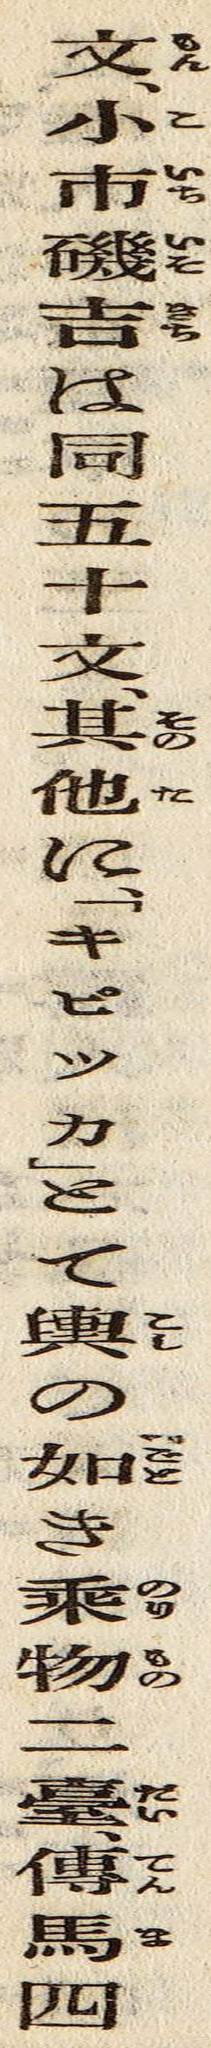文、小市磯吉は同五十文、其他に、「キピツカ」とて輿の如き乗物二台、伝馬四
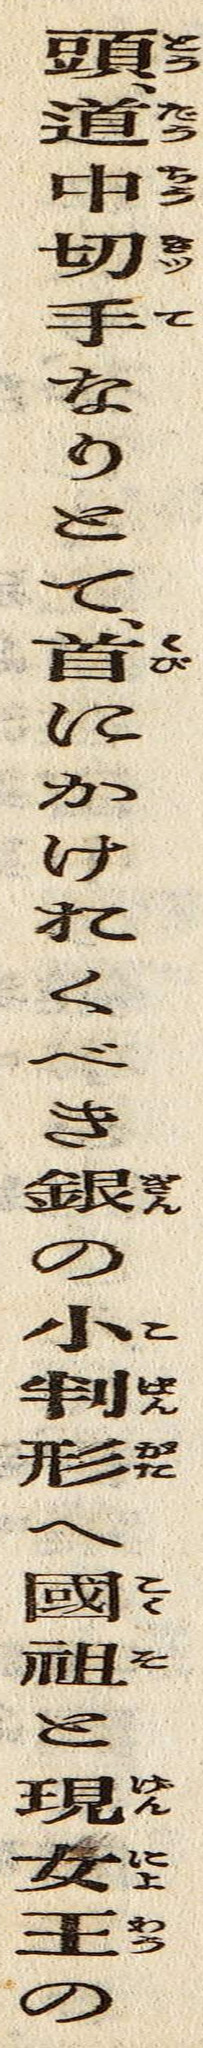頭、道中切手なりとて、首にかけおくべき銀の小判形へ国祖と現女王の
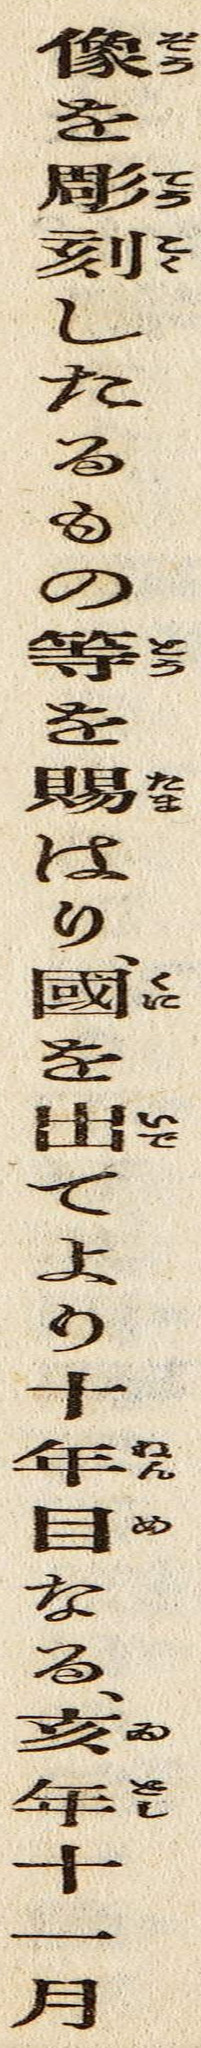像を彫刻したるもの等を賜はり、国を出てより十年目なる、亥年十一月
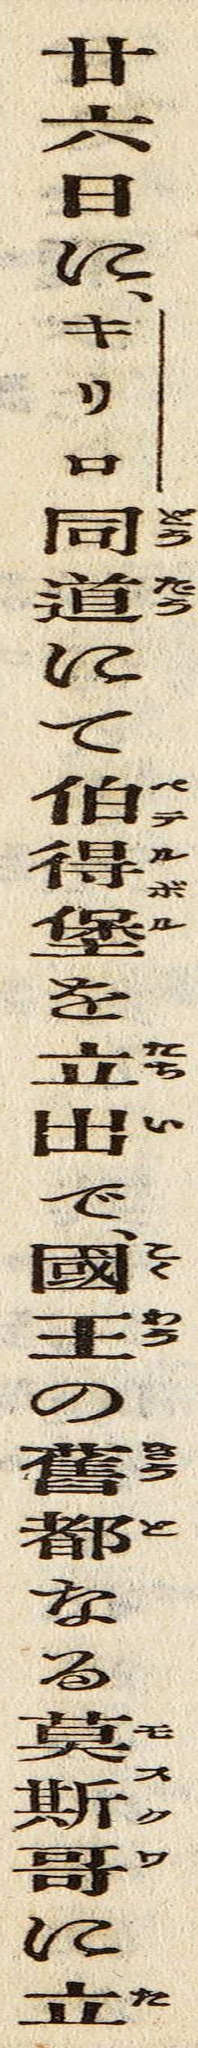二十六日にキリロ同道にて伯得堡を立出で、国王の旧都なる莫斯哥に立
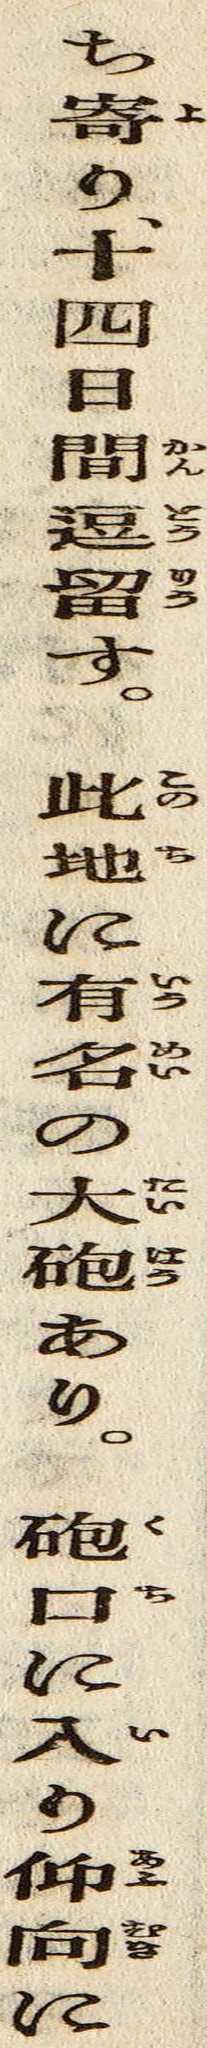ち寄り、十四日間逗留す。此地に有名の大砲あり。砲口に入り仰向に
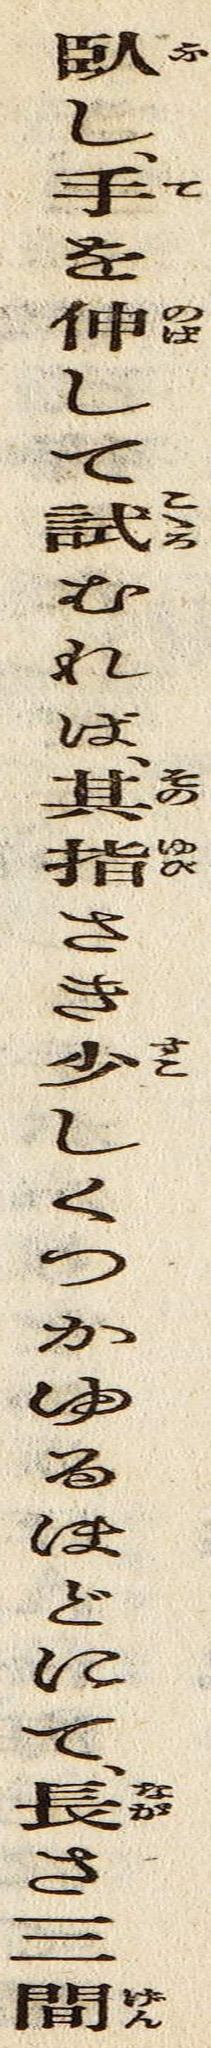臥し、手を伸して試むれば、其指さき少しくつかゆるほどにて、長さ三間
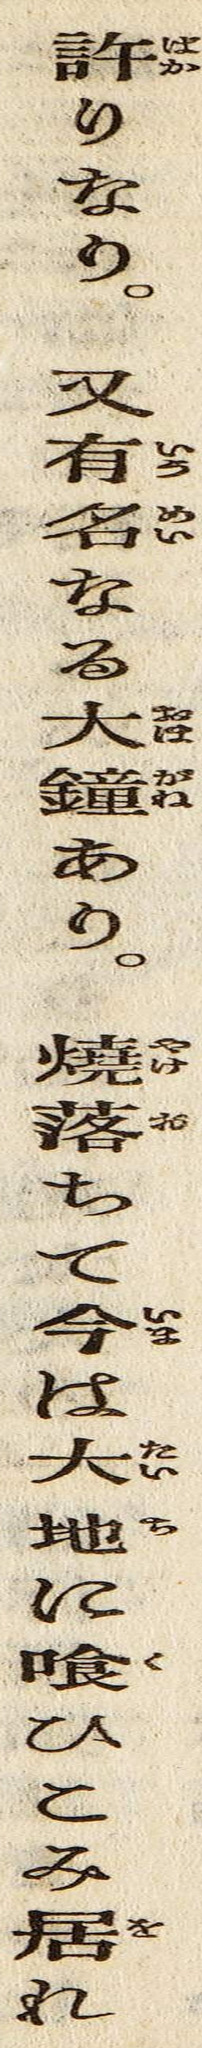許りなり。又有名なる大鐘あり。焼落ちて今は大地に喰いこみ居れ
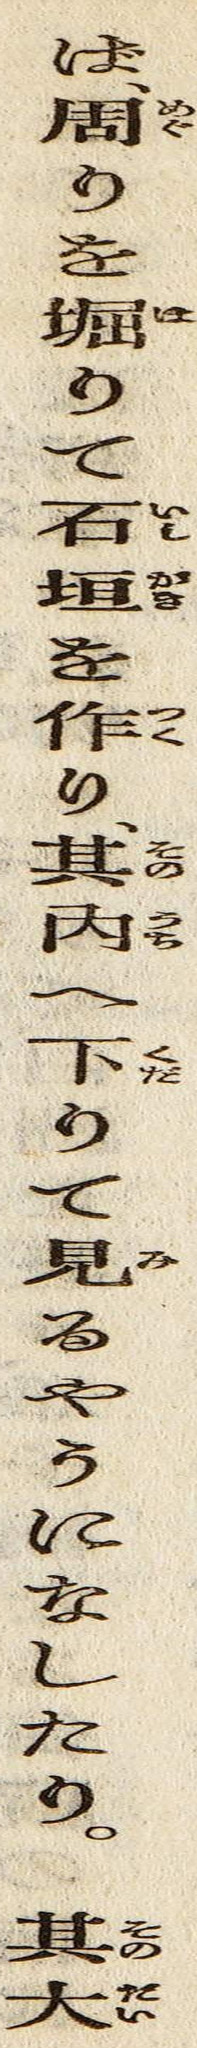ば、周りを堀りて石垣を作り、其内へ下りて見るやうになしたり。其大
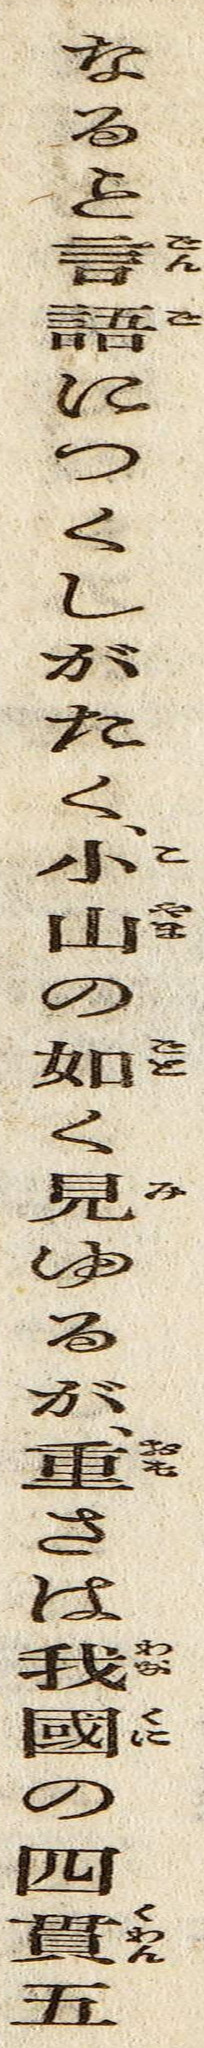なること言語につくしがたく、小山の如く見ゆるが、重さは我国の四貫五
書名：日本漂流譚
